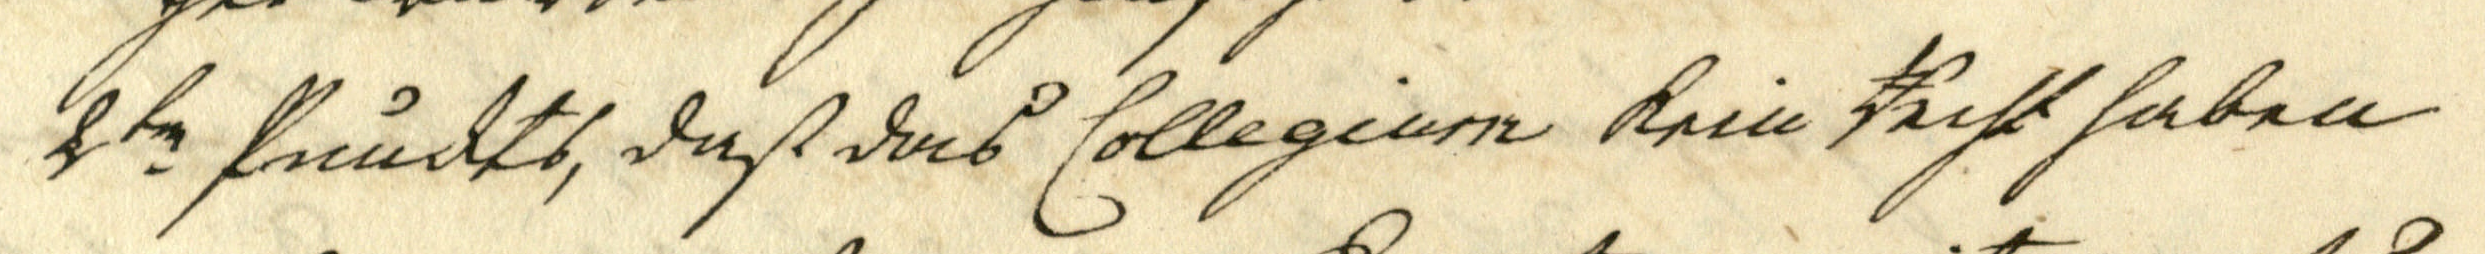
2 ten Punckts, daß das Collegium kein Recht haben
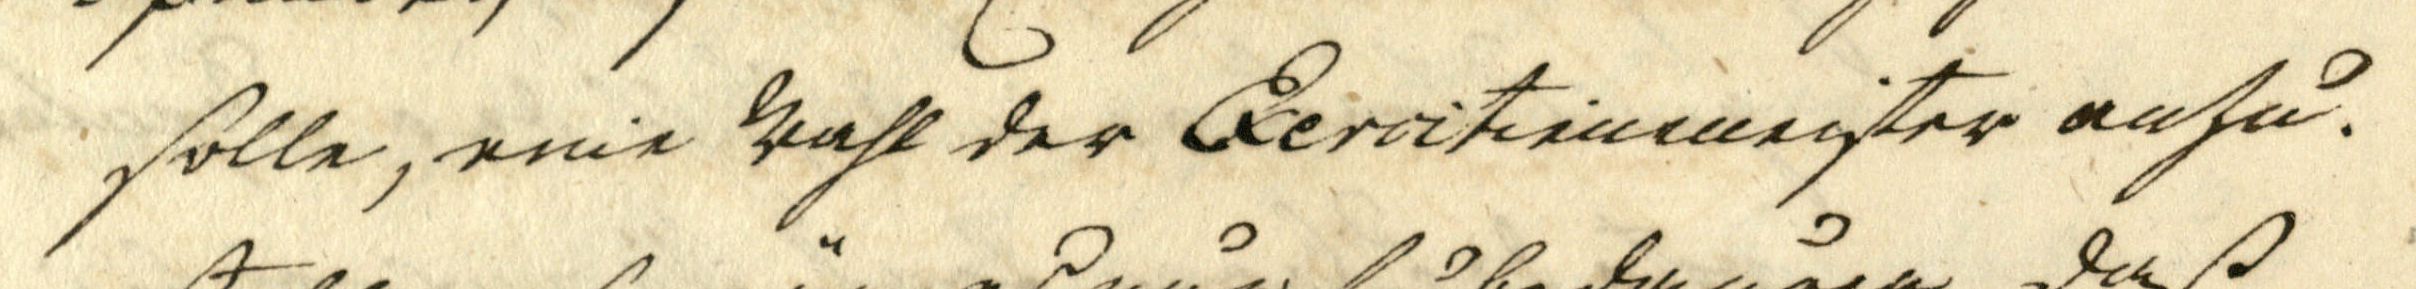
solle, eine Wahl der Exercitienmeister anzu¬
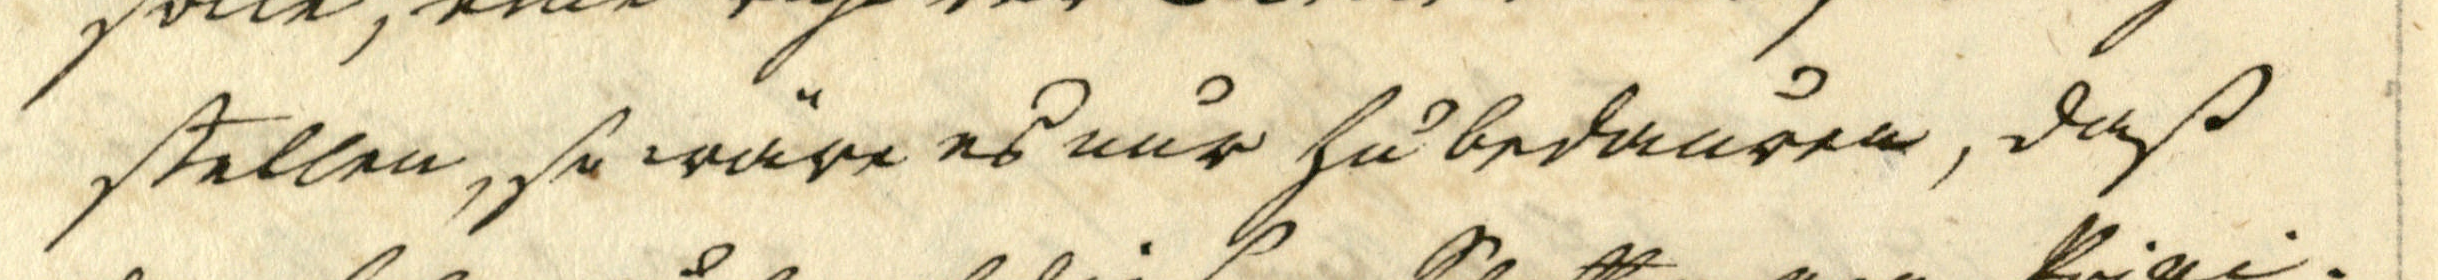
stellen, so wäre es nur zu bedauren, daß
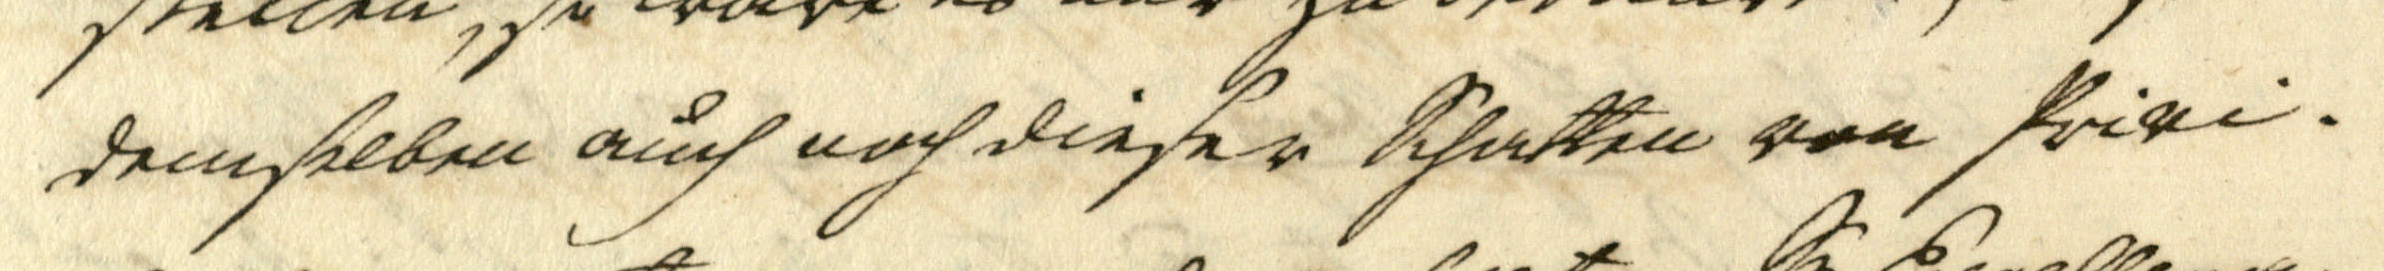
demselben auch noch dieser Schatten von Privi-
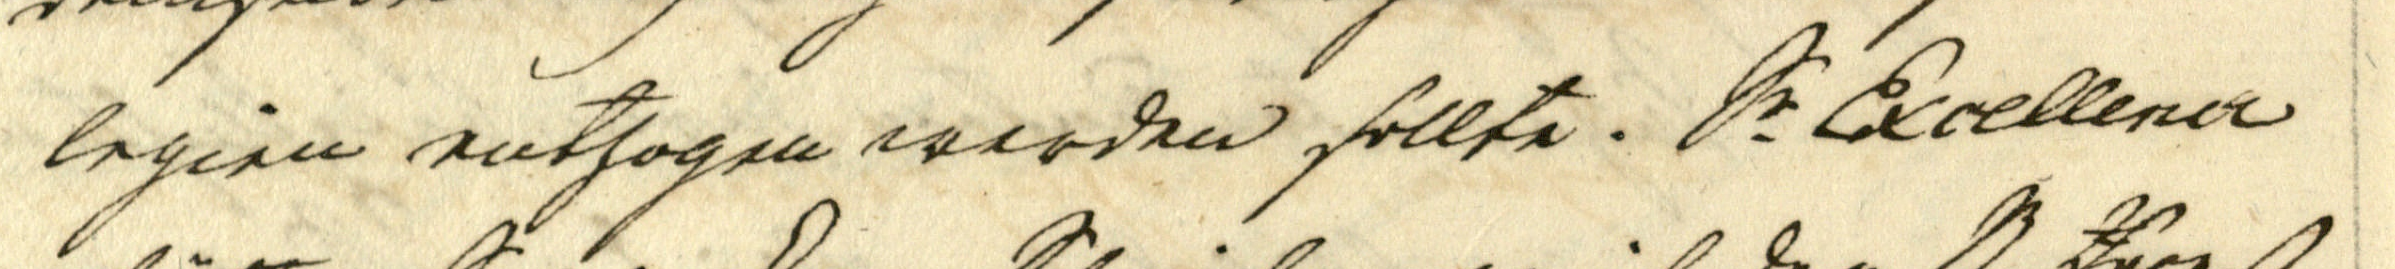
legien entzogen werden sollte. Sr Excellence
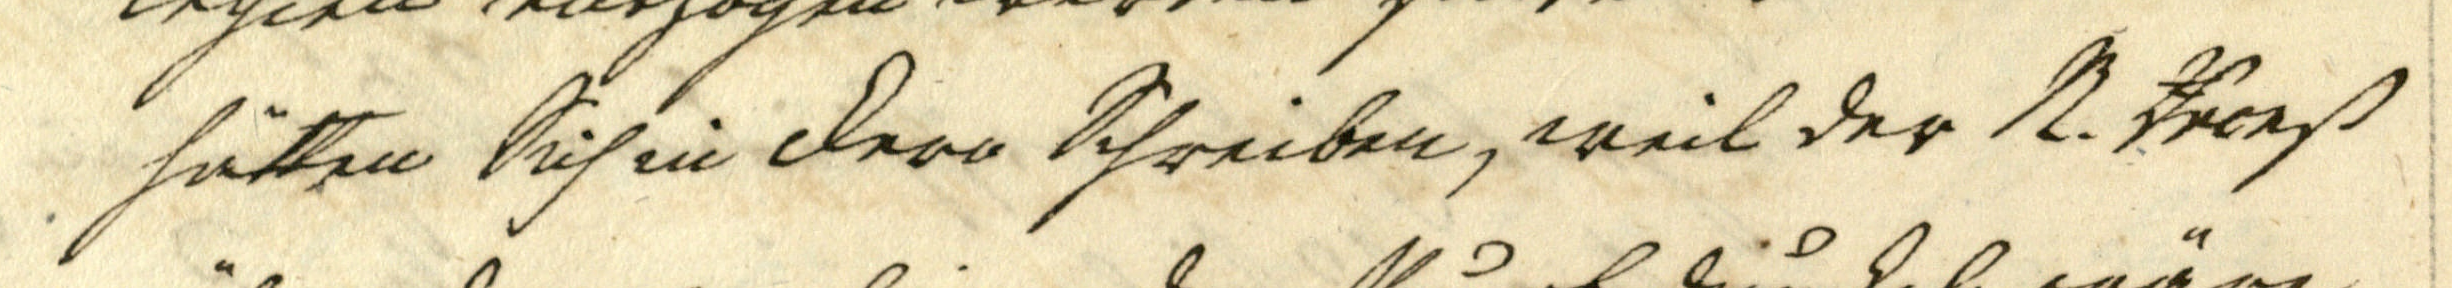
hätten Sich in Dero Schreiben, weil der N. Receß
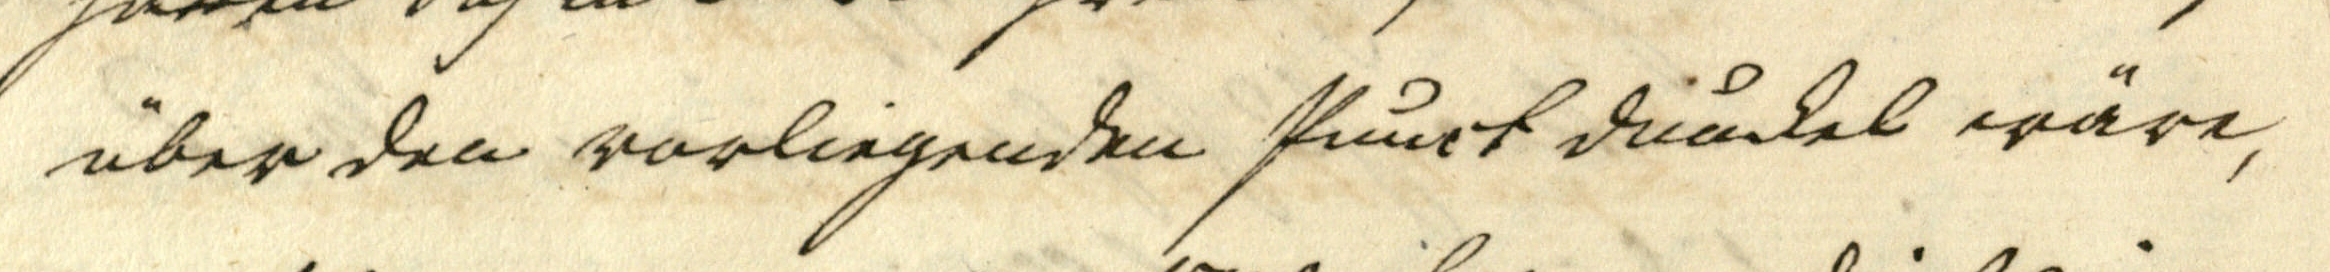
über den vorliegenden Punct dunckel wäre,
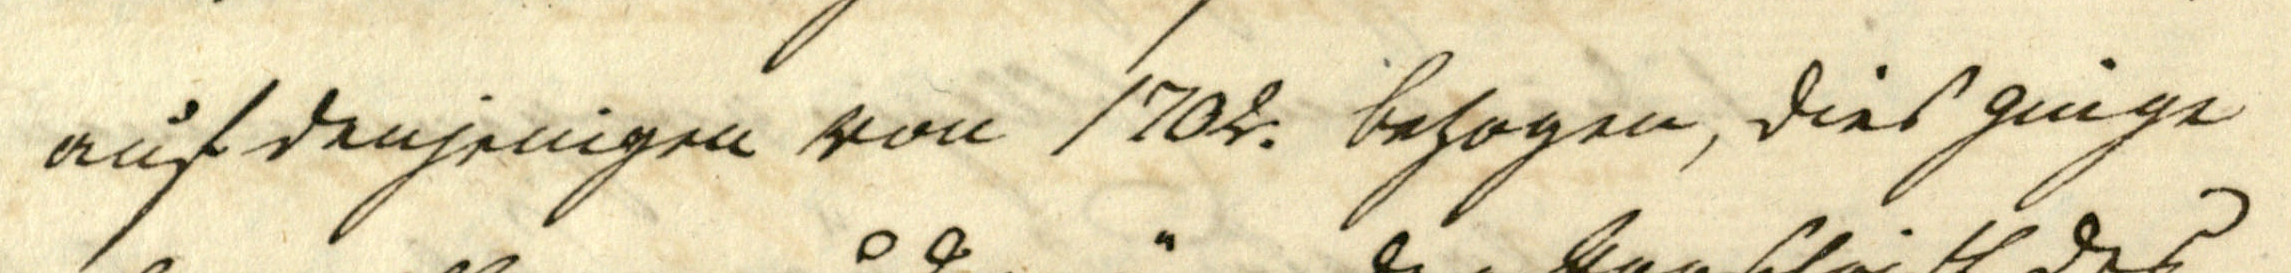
auf denjenigen von 1702. bezogen, dies ginge
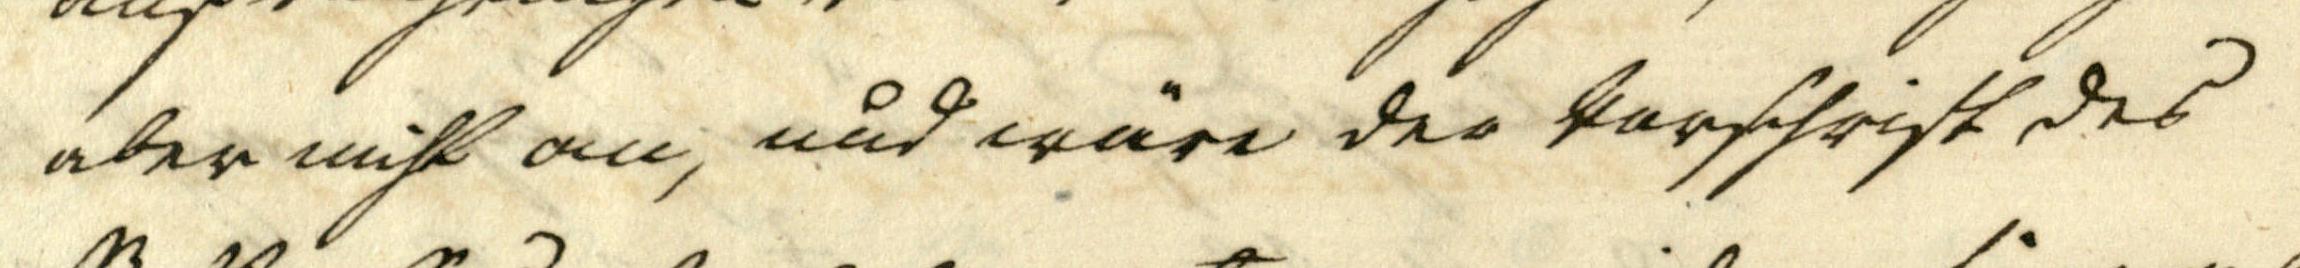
aber nicht an, und wäre der Vorschrift des
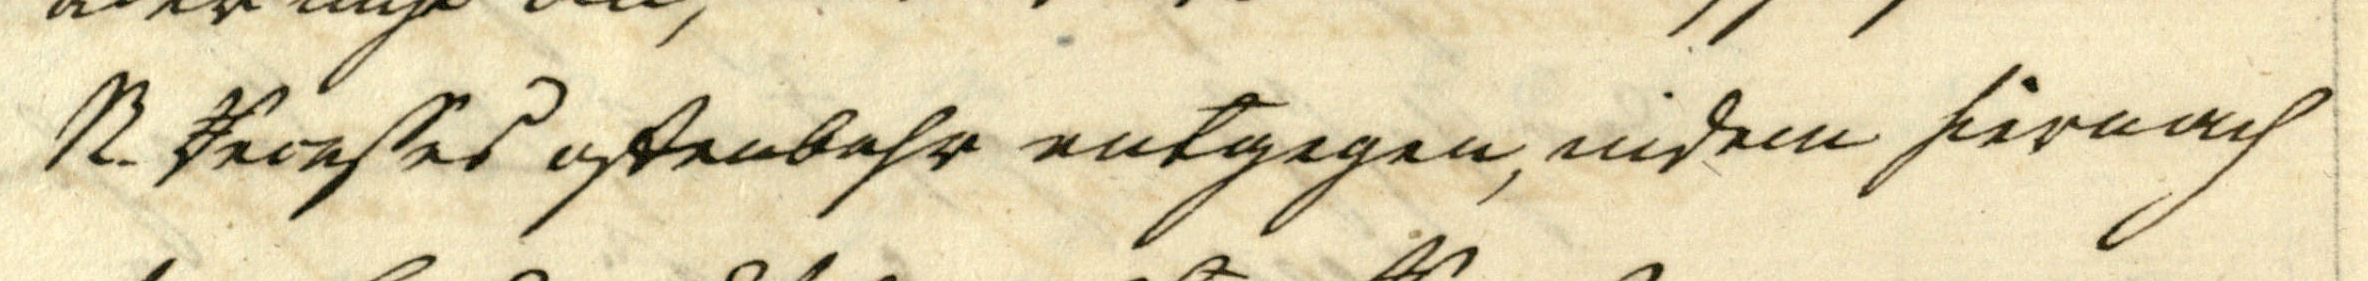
N Recesses offenbahr entgegen, indem hiernach
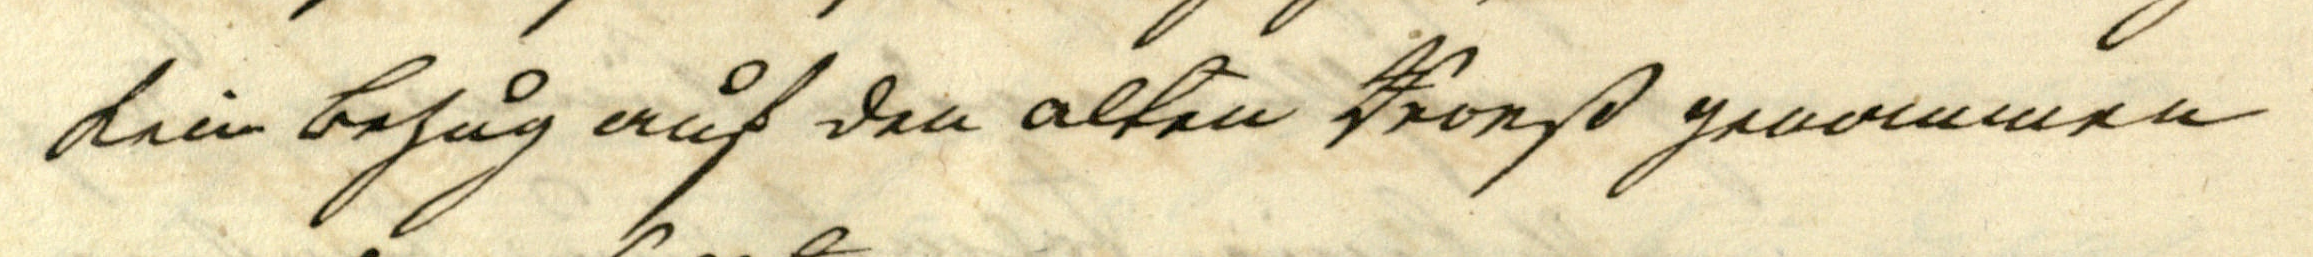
kein Bezug auf den alten Receß genommen
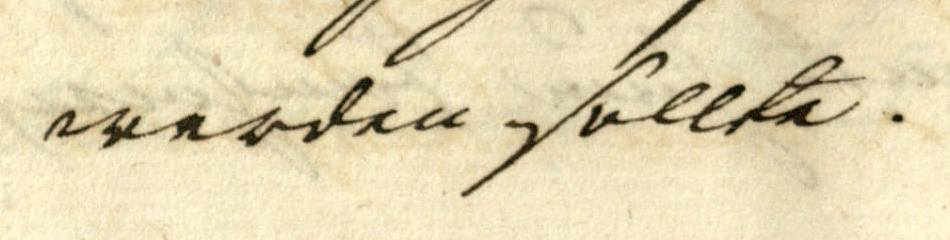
werden sollte.
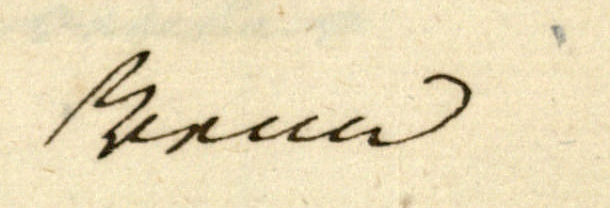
Wenn
